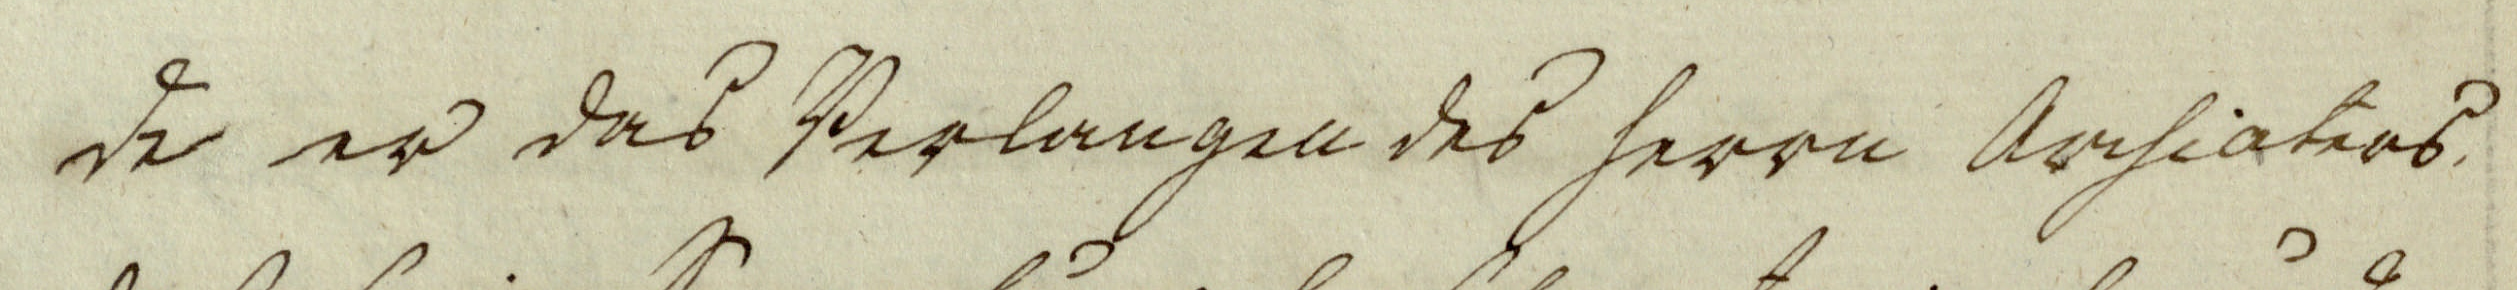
de er das Verlangen des Herrn Archiaters,
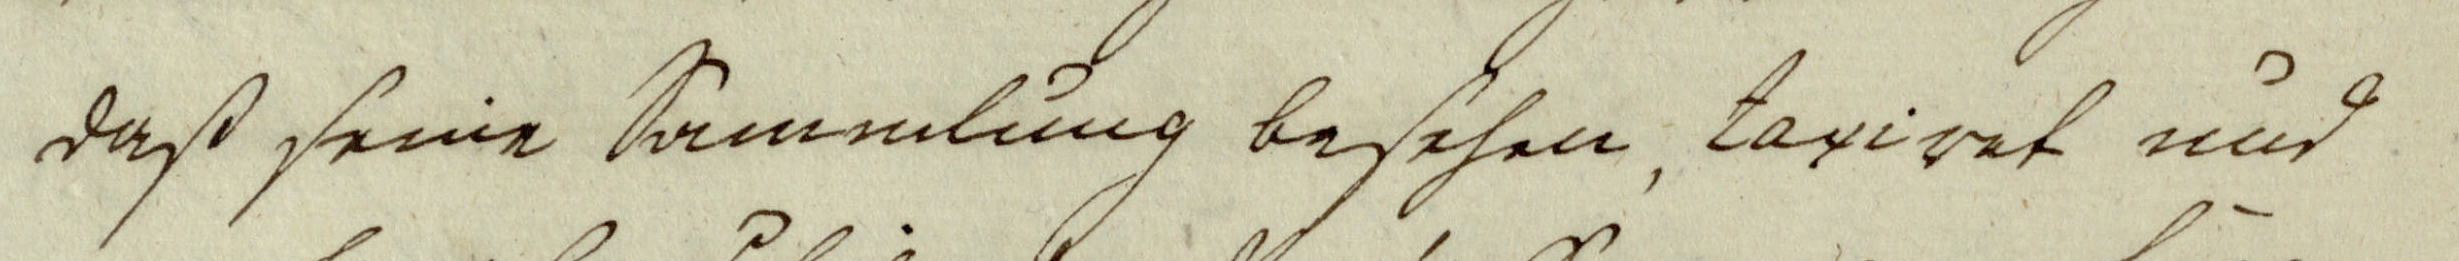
daß seine Sammlung besehen, taxiret und
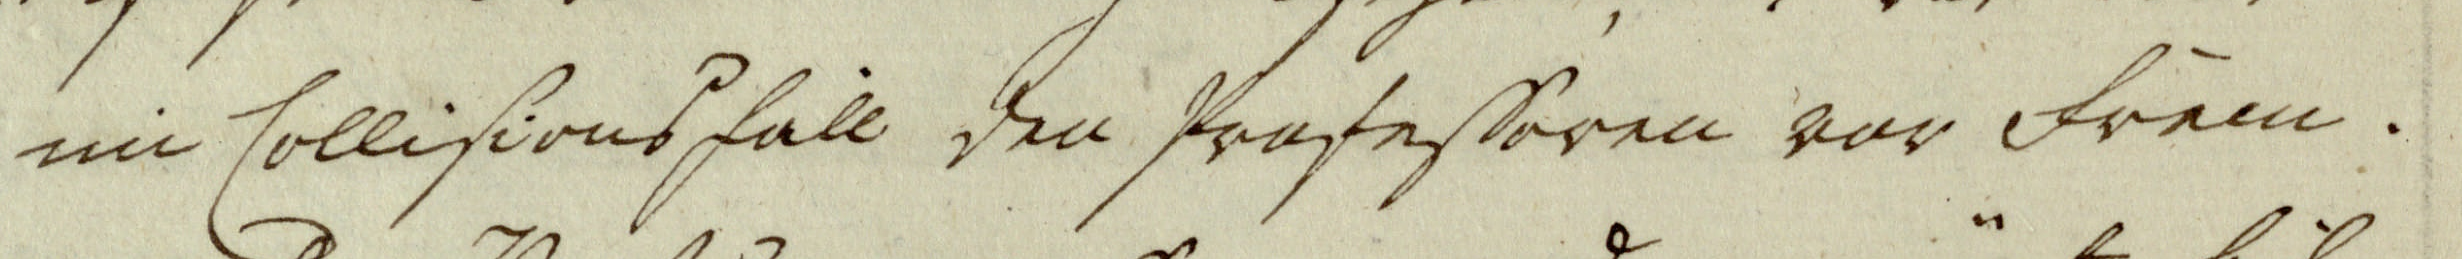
im Collisionsfall den Professoren vor Frem¬
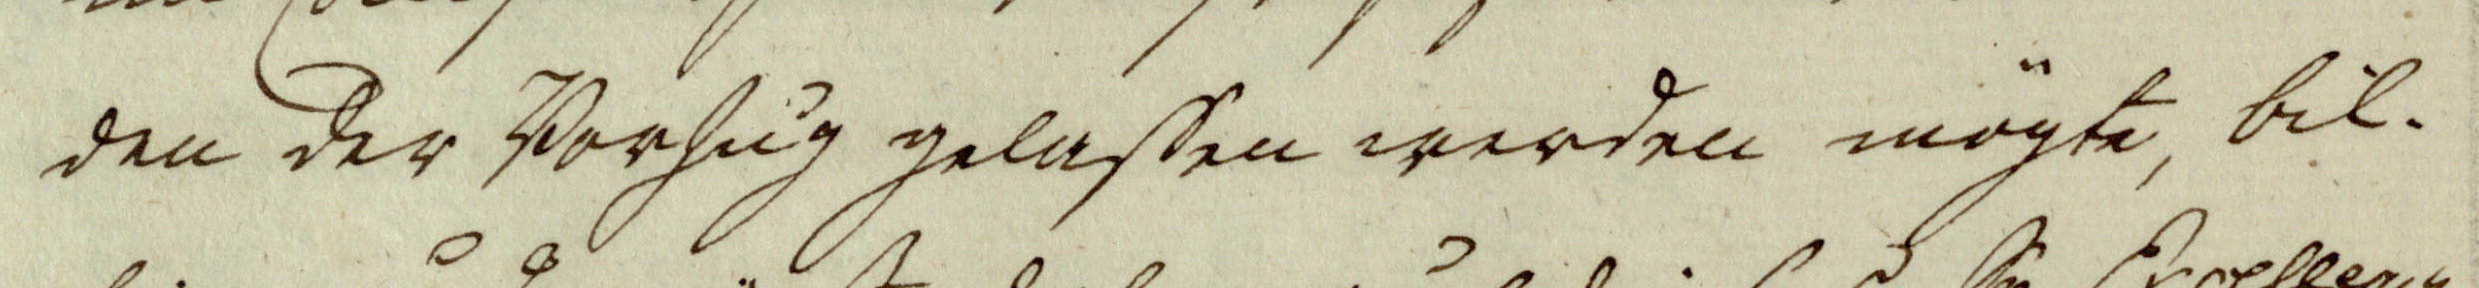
den der Vorzug gelassen werden mögte, bil¬
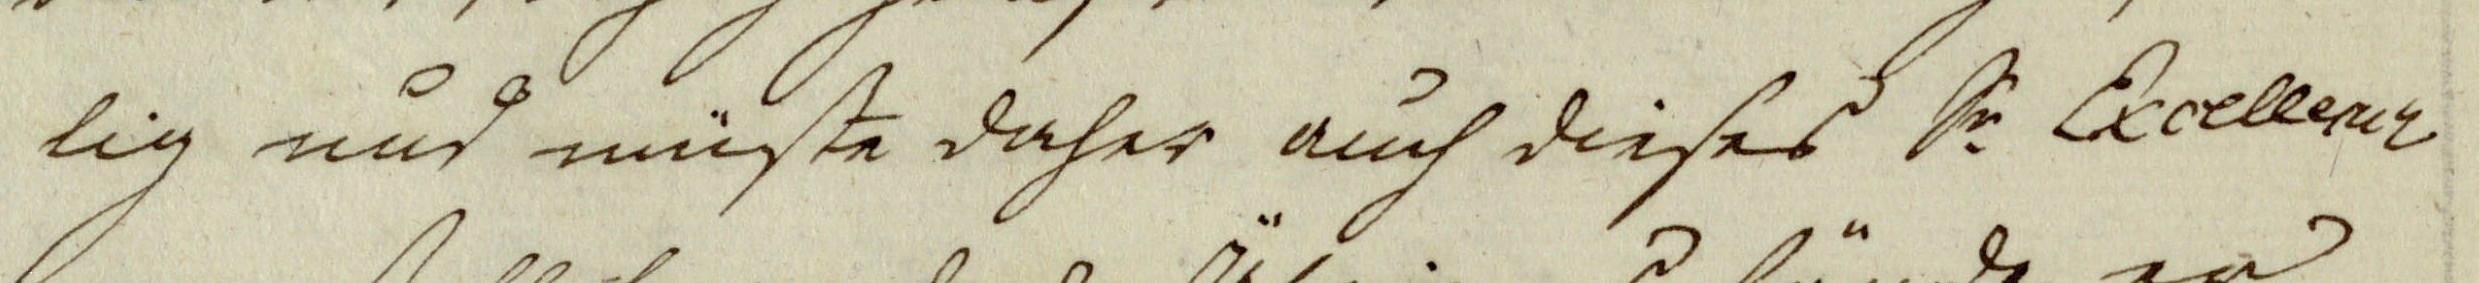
lig und müßte daher auch dieses Sr Excellence
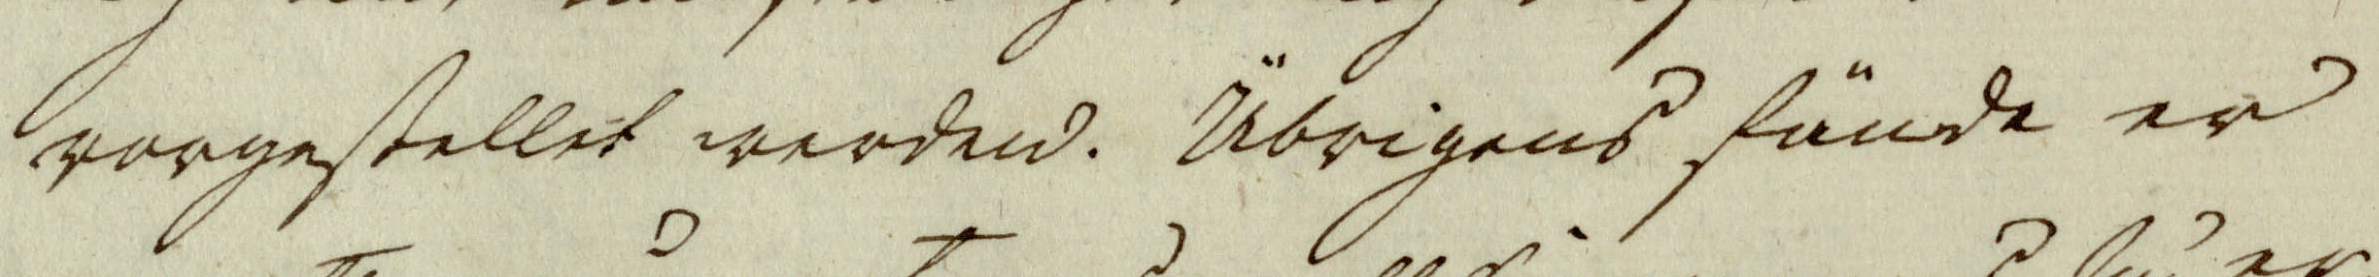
vorgestellet werden. Übrigens fände er
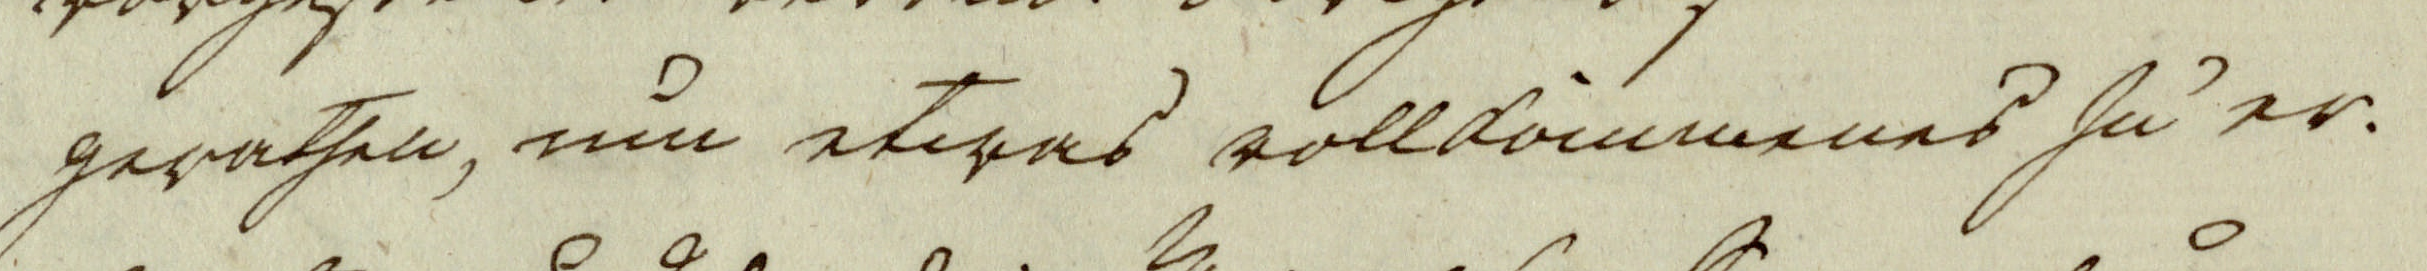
gerathen, um etwas vollkommenes zu er¬
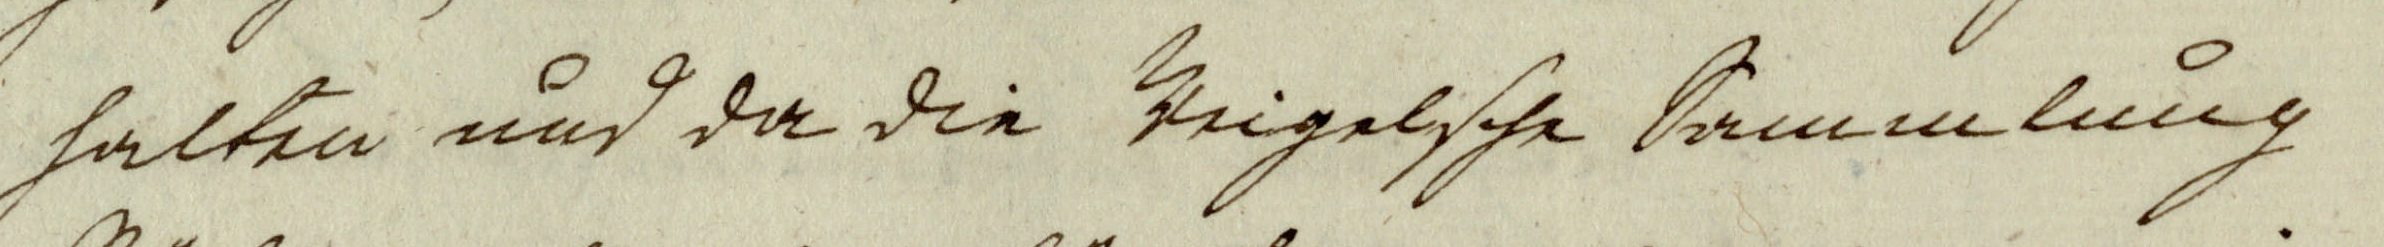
halten und da die Weigelsche Sammlung
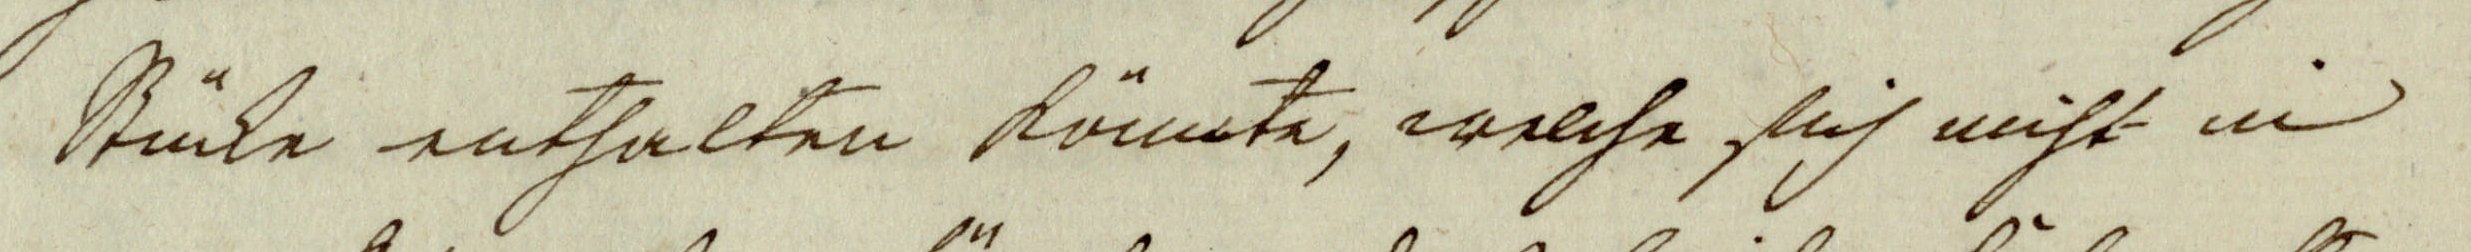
Stücke enthalten könnte, welche sich nicht in
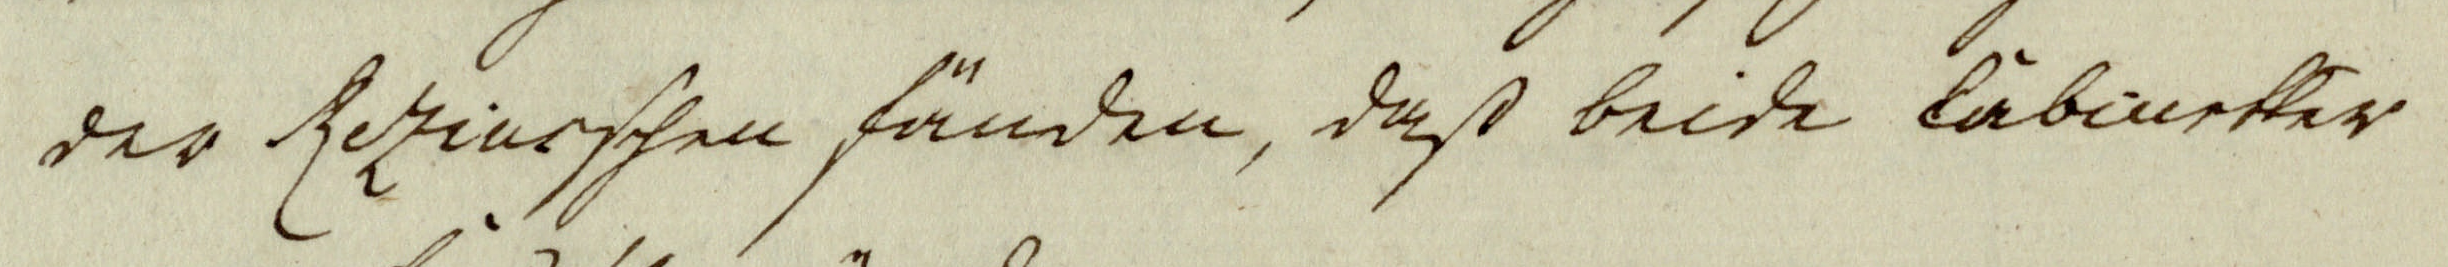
der Reziusschen fänden, daß beide Cabinetter
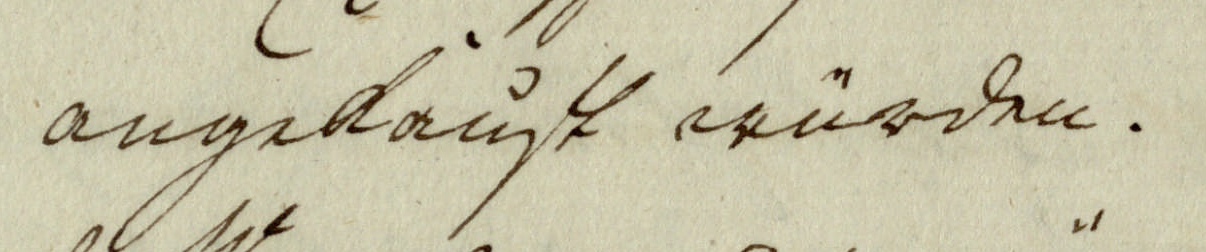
angekauft würden.
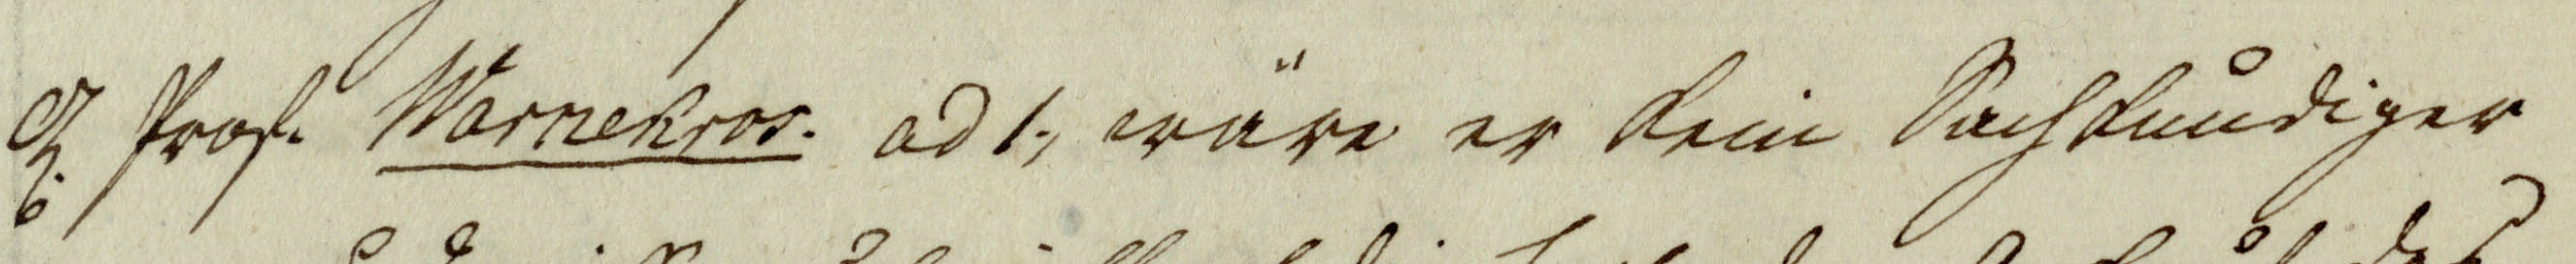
dh. Prof. Warnekros. ad 1., wäre er kein Sachkundiger
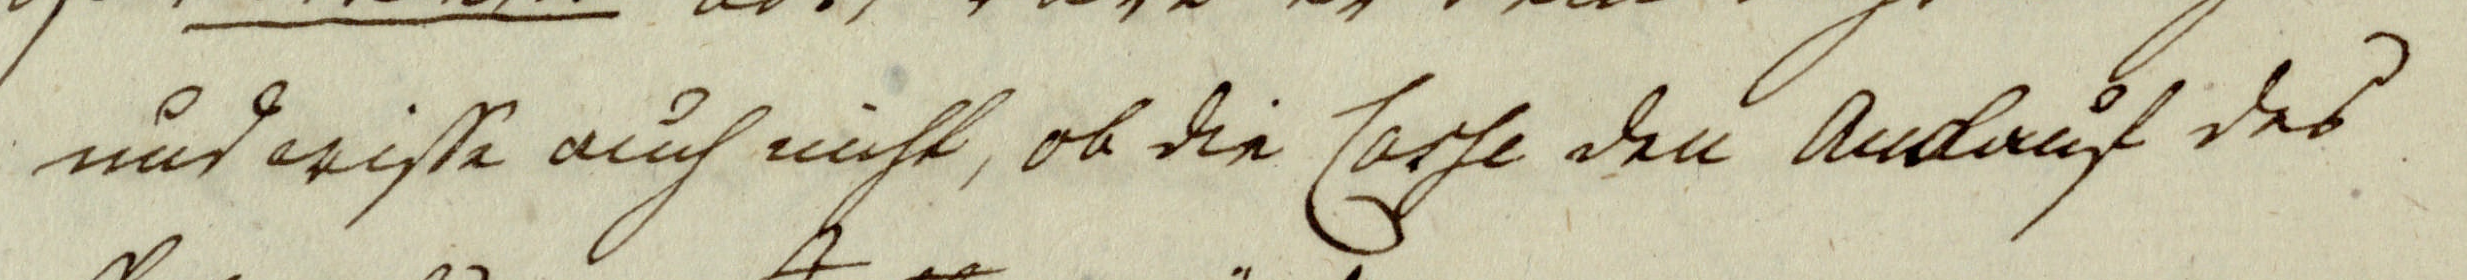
und wisse auch nicht, ob die Casse den Ankauf des
